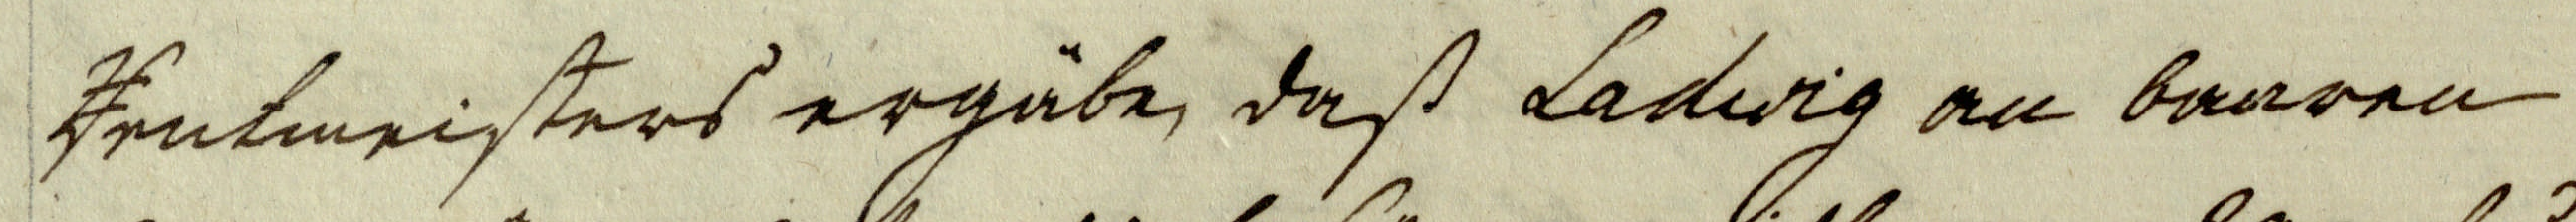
Rentmeisters ergäbe, daß Ladwig an baaren
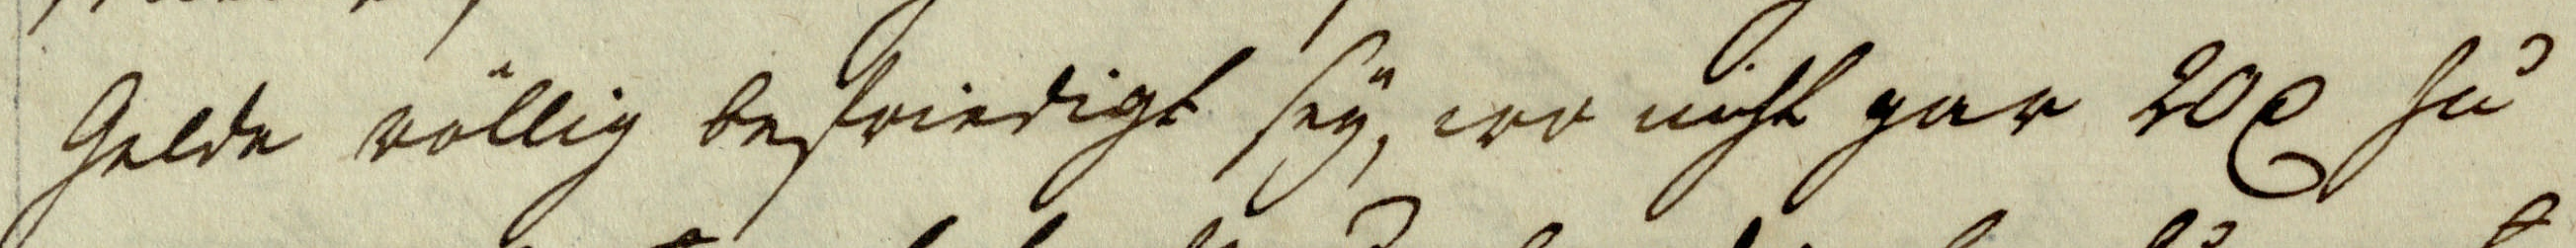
Gelde völlig befriedigt seÿ, wo nicht gar 20 rtl. zu
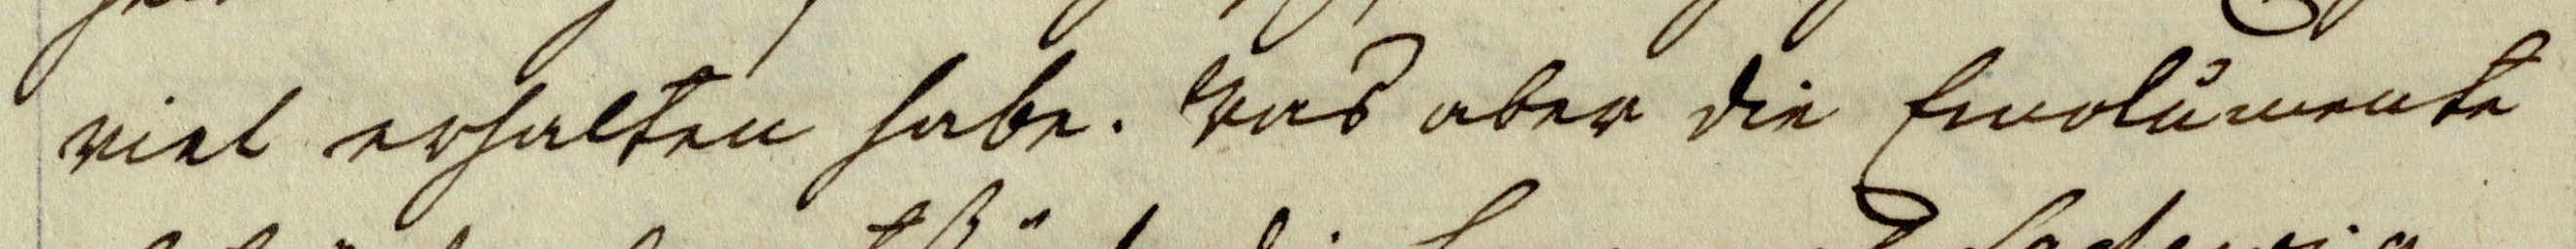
viel erhalten habe. Was aber die Emolumente
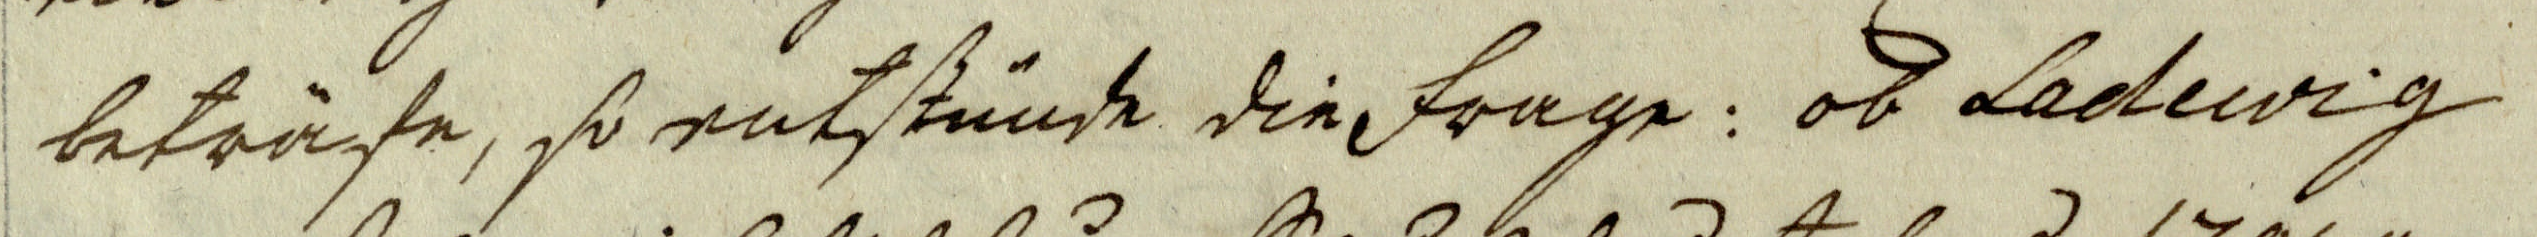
beträfe, so entstünde die Frage: ob Ladewig
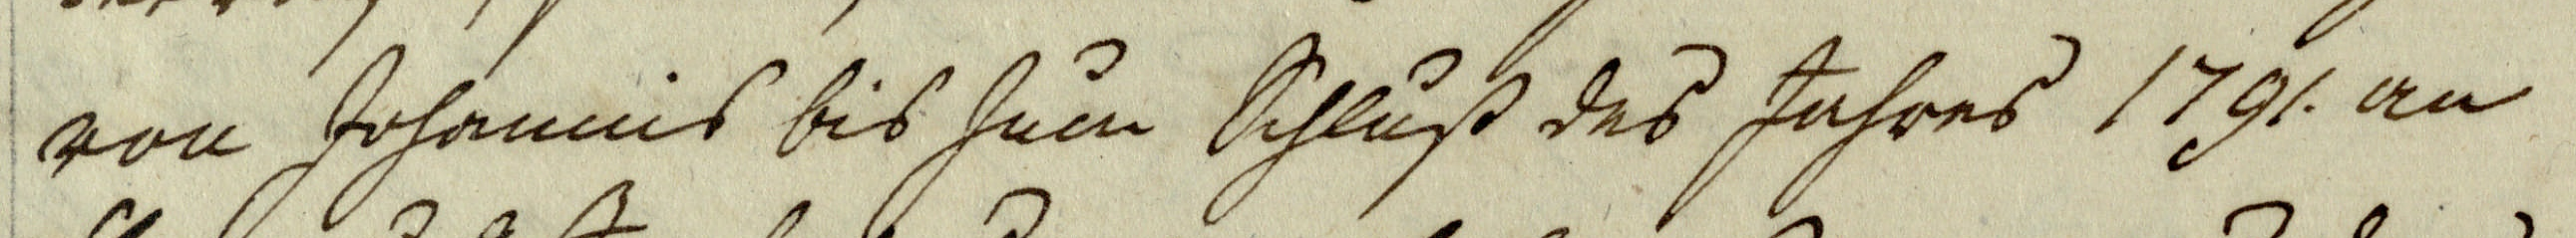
von Johannis bis zum Schluß des Jahres 1791. an
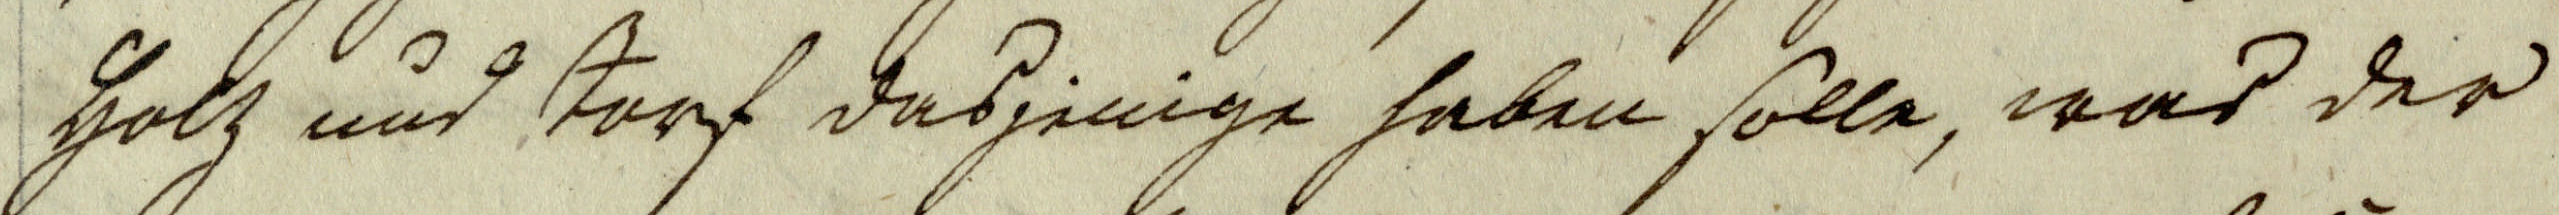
Holz und Torf dasjenige haben solle, was der
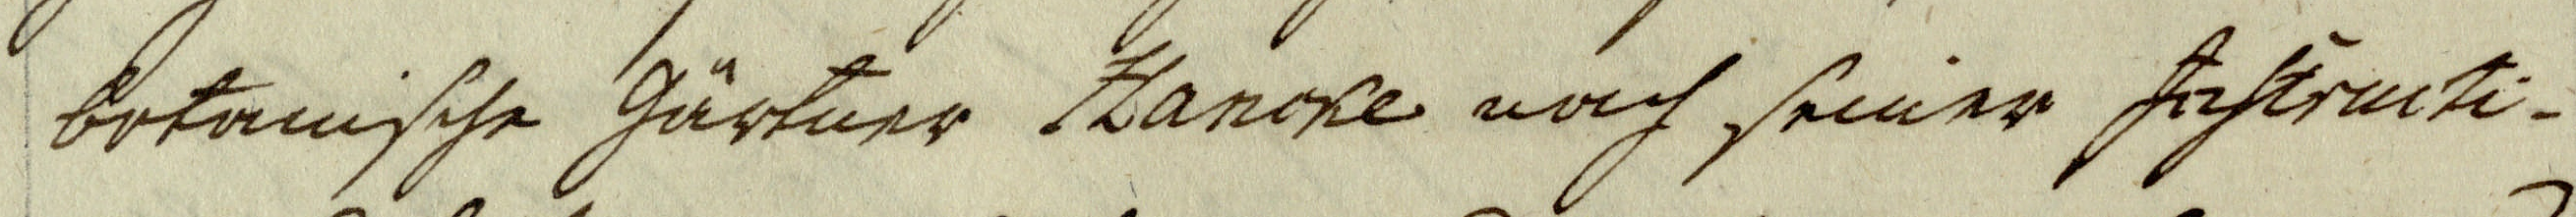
botanische Gärtner Hancke nach seiner Instructi¬
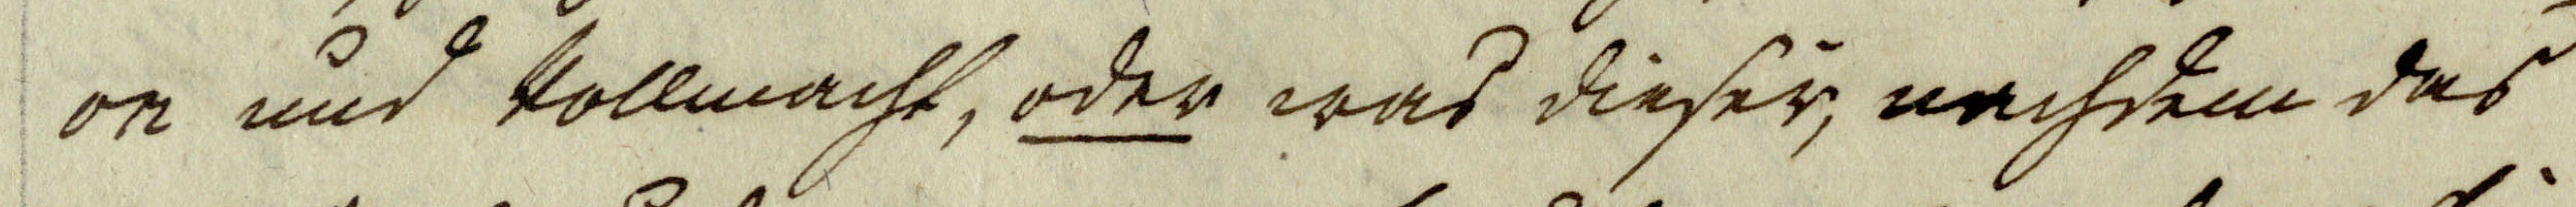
on und Vollmacht, oder was dieser, nachdem das
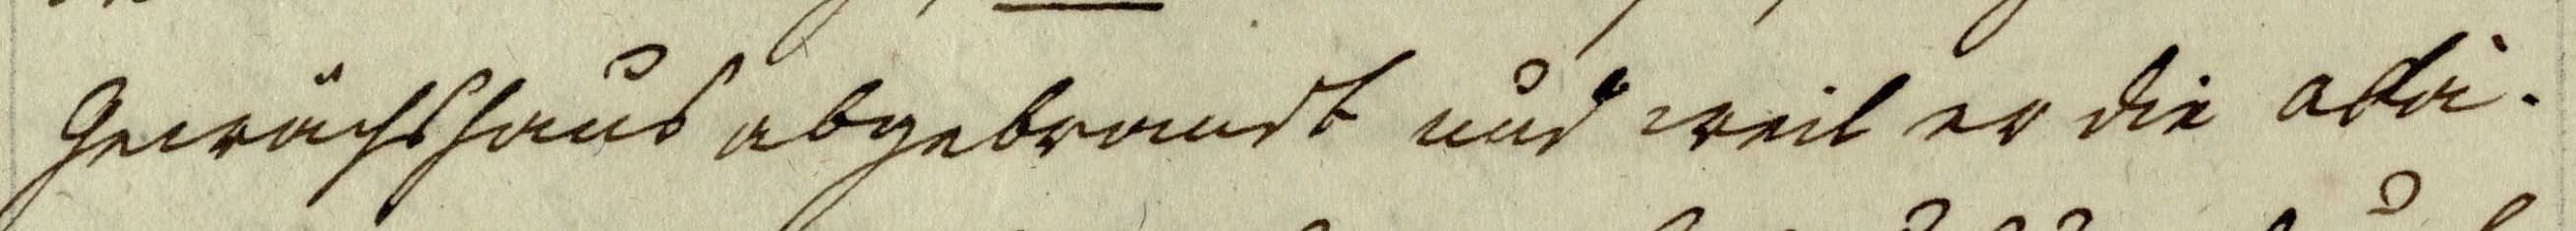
Gewächshaus abgebrannt und weil er die aka¬
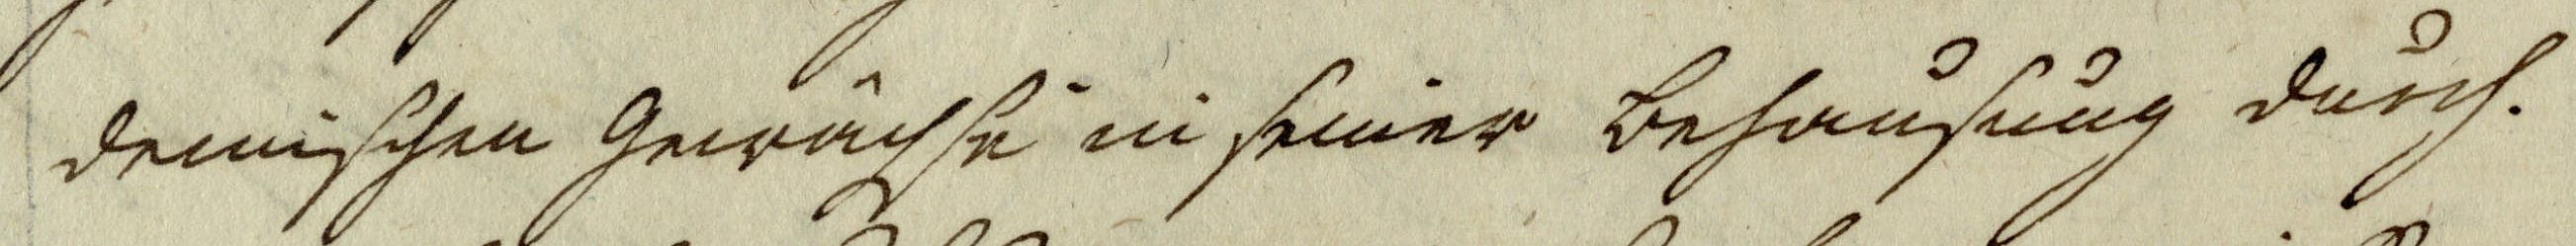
demischen Gewächse in seiner Behausung durch¬
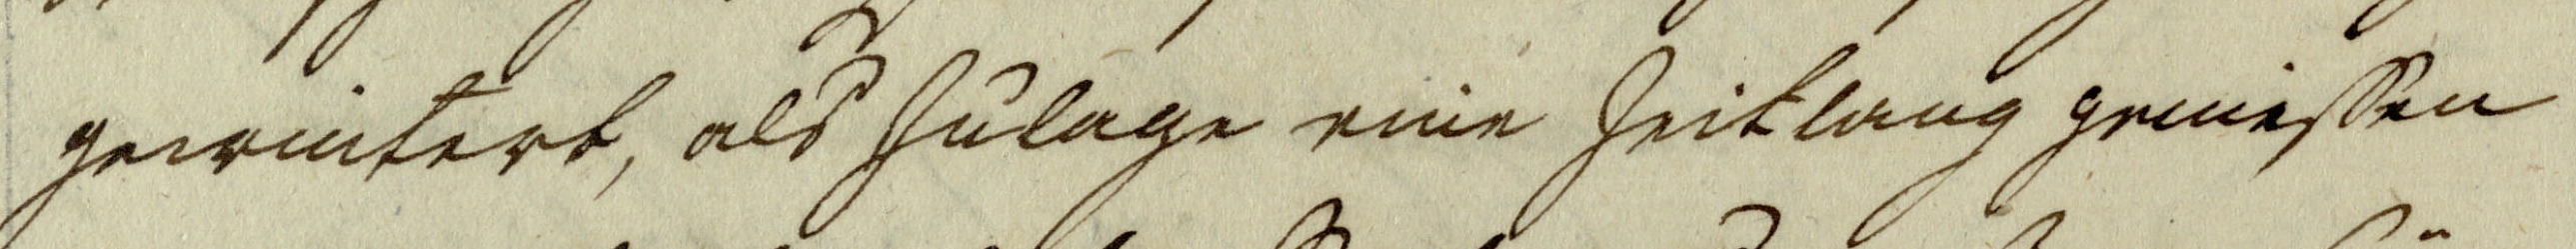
gewintert, als Zulage eine zeitlang geniessen
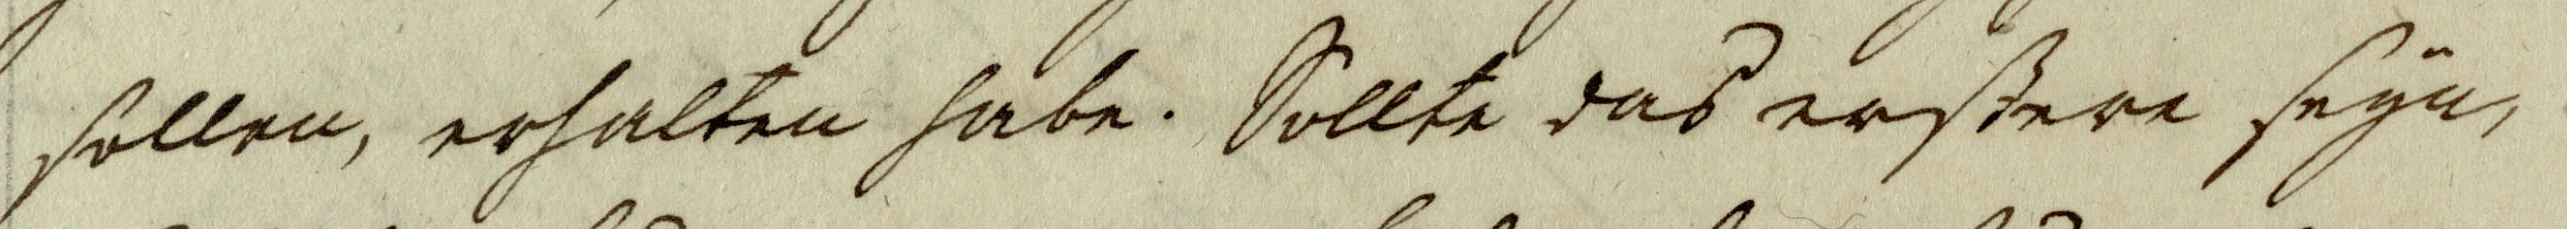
sollen, erhalten habe. Sollte das erstere seÿn,
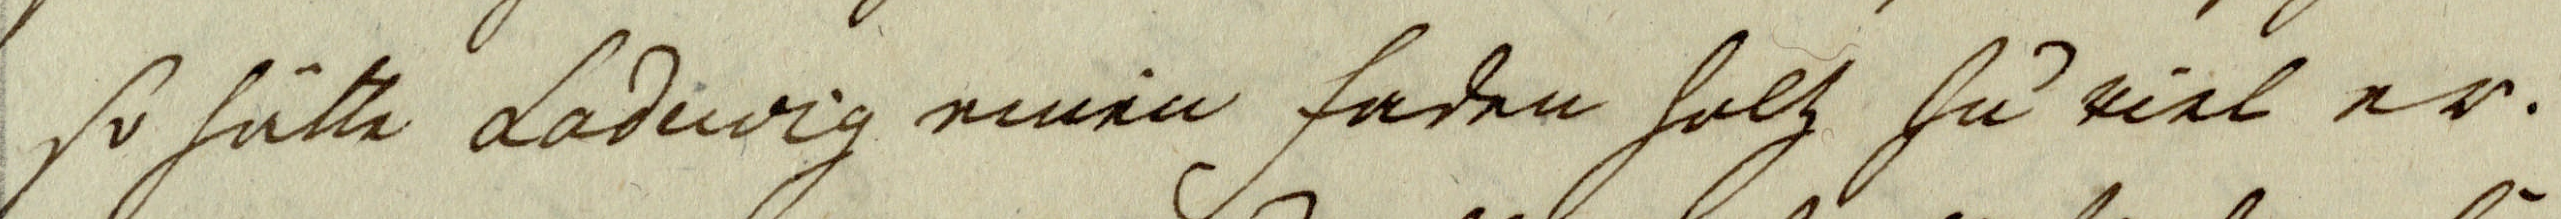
so hätte Ladewig einen Faden Holz zu viel er¬
